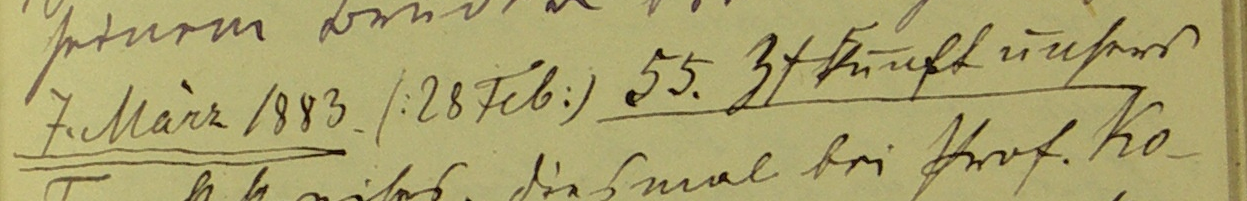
7: ??? 1883. ( :28 ???. : ) 55 Zskunft unsers
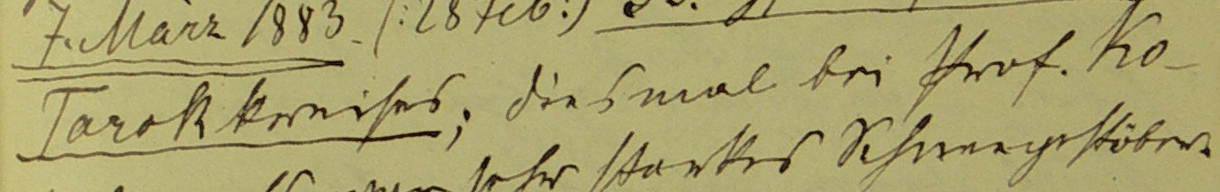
???kreises: Diesmal bei Prof. ???
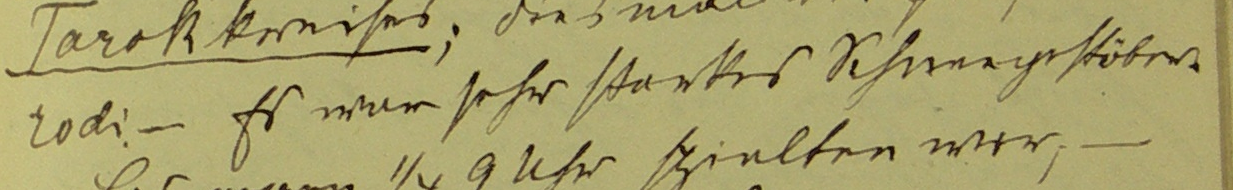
??? .- Es war sehr starkes Schneegestöber. -
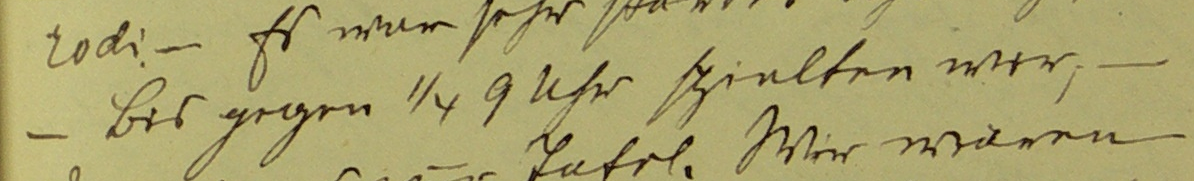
Bis gegen ¼ 9 Uhr spielten wir, -
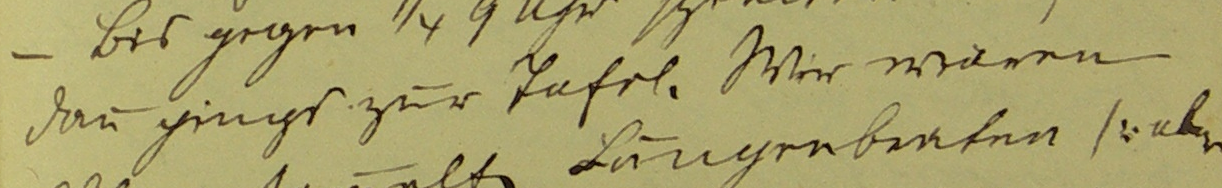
dann gings zur Tafel. Wir waren
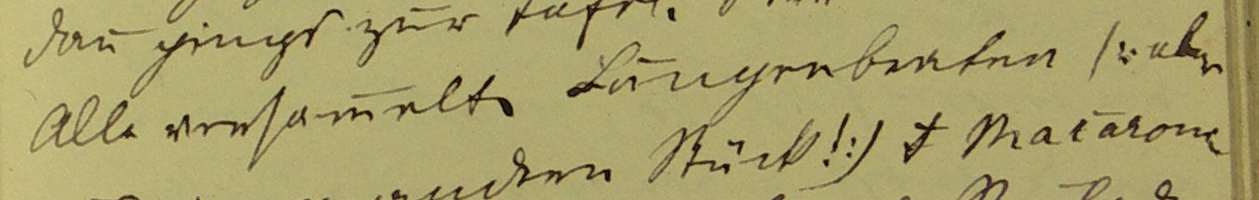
Alle versammelt. Lungenbraten (: aber
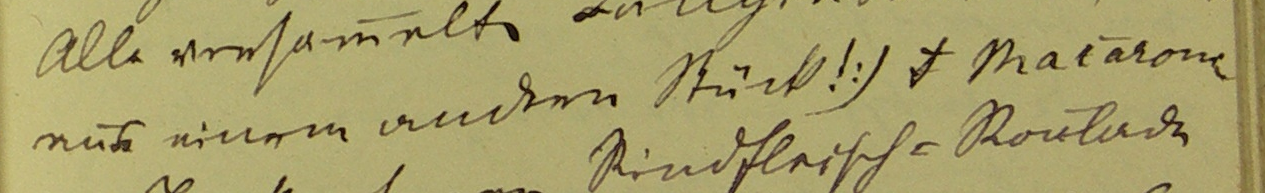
aus einem anderen Stück!:) t ???
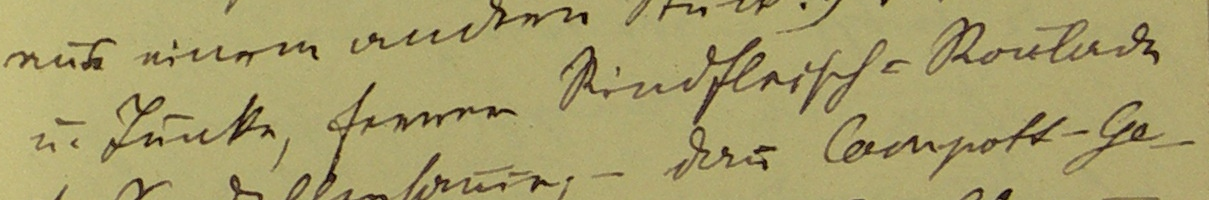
u. Tunke, fener Rindfleisch –Roulade
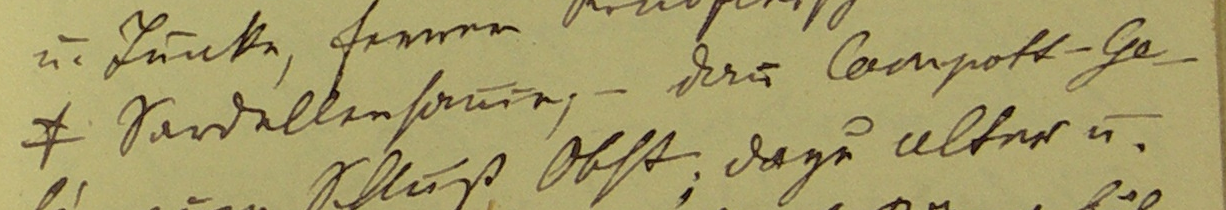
t Sardellensauce;- dann ???- ???
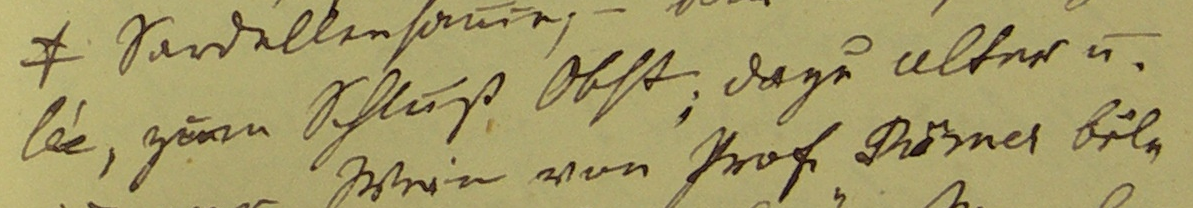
???, zum Schluß Obst; dazu alter u.
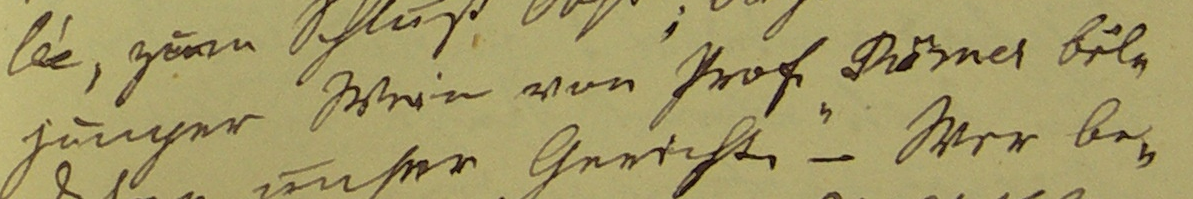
junger Wein von Prof. ??? bil¬
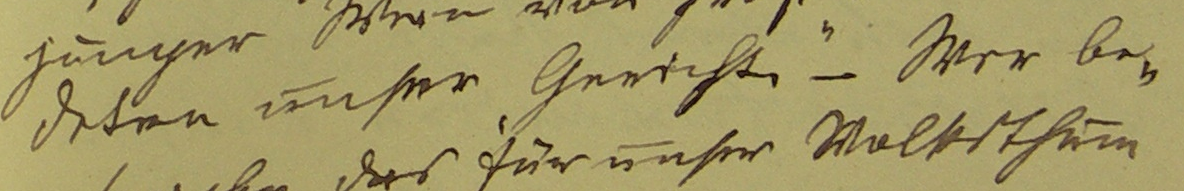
deten unser“ Gericht“,-- Wir be¬
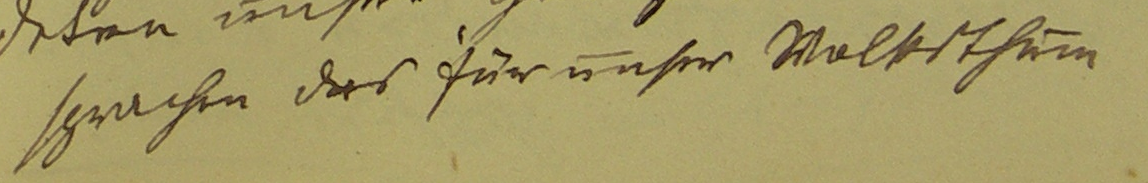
sprachen das für unser Volksthum
